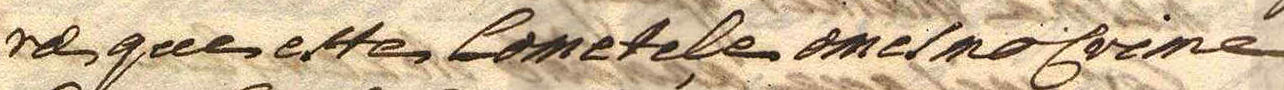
ra que este CometeÇe o mesmo Crime
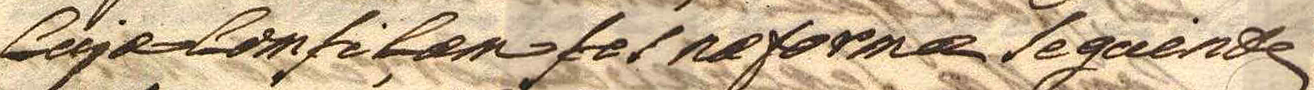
Cuja ComfiÇam fes na forma seguinte
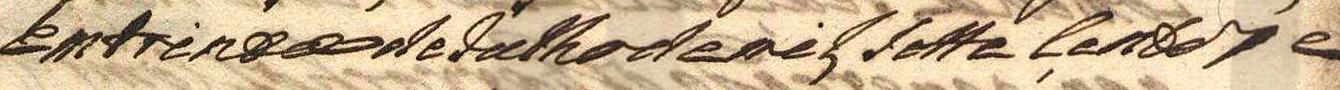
em trinta de Iulho de mil setteCentos e
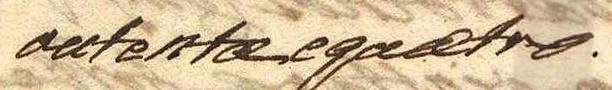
outenta e quatro.
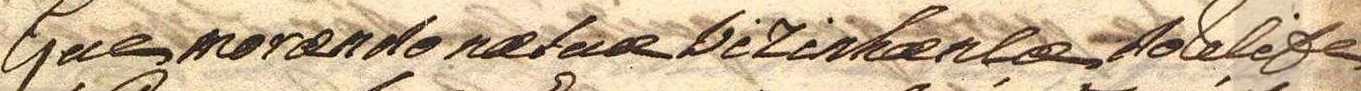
Que morando na sua vizinhanÇa do ReÇife
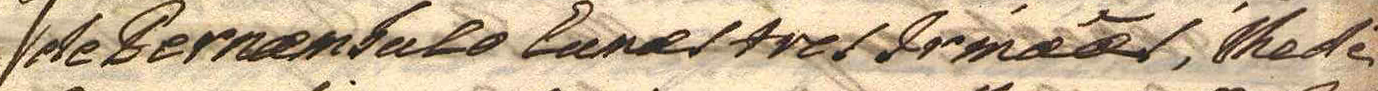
de Pernambuco humas tres Irmaās, lhe di
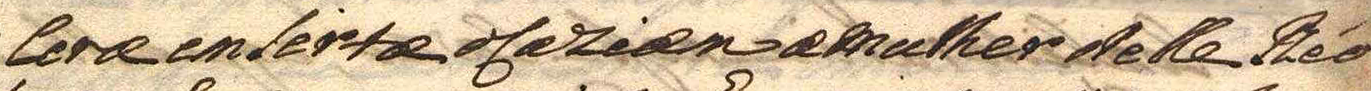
Çera em serta oCaziam a mulher delle Réo
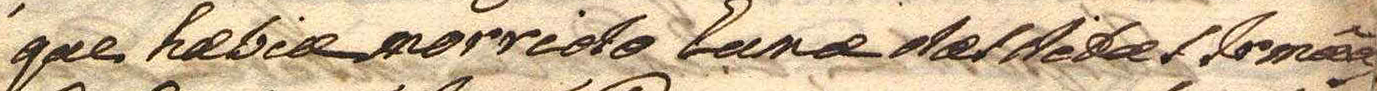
que havia morrido huma das ditas Irmaās
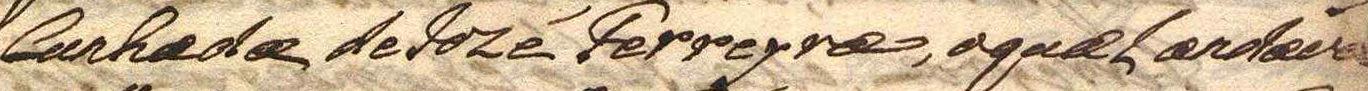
Cunhada de Iozé Ferreyra, o qual andava
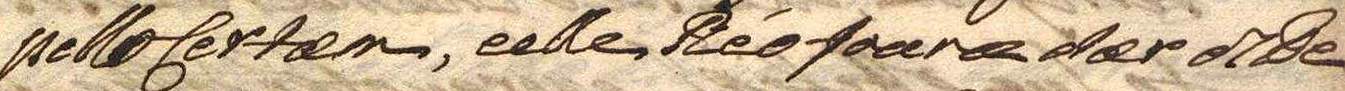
pello Certam, e elle Réo foura dar os Pe
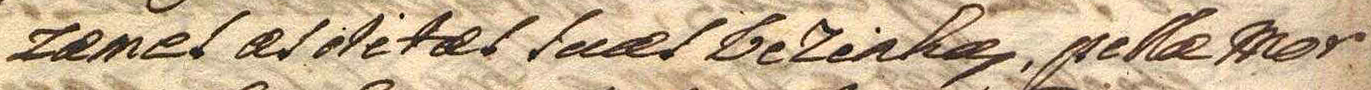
zames as ditas suas vezinhas, pella mor
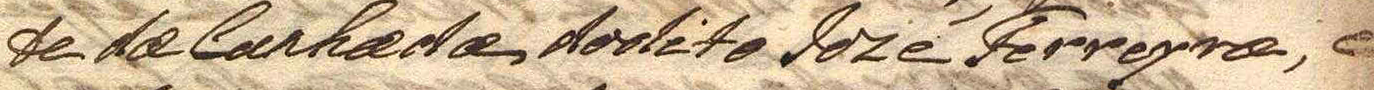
te da Cunhada do dito Iozé Ferreyra, e
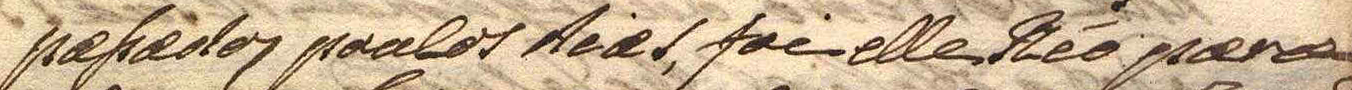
passados pouCos dias, foi elle Réo para
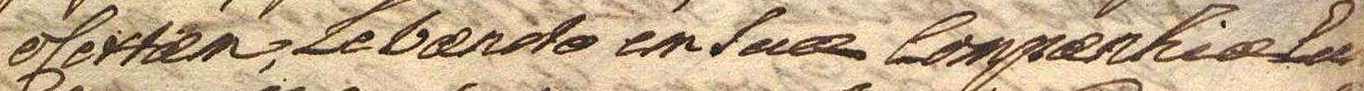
o Certam, Levando em sua Companhia hu
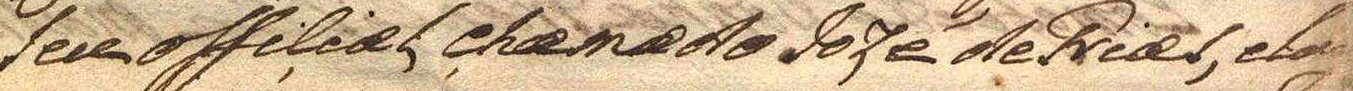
seu offiÇial çhamado Iozé de Frias, e log
